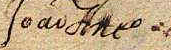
Joaõ Anto
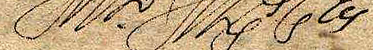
Mto. Illrses sres
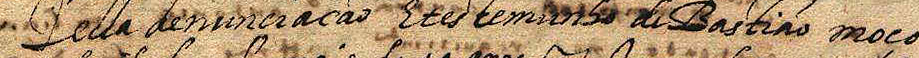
Pella denunçiacão E testemunho de Bastiaõ moço
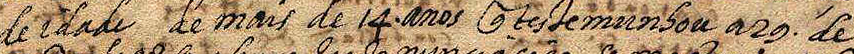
de idade de mais de 14. anos q̄ testemunhou a 29. de
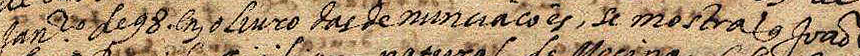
Jan.ro de 98. em o liuro das denunciacoes, se mostra q̄ Joaõ
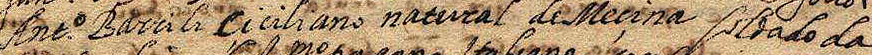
Ant.o Barrili Çiciliano natural de Meçina soldado da
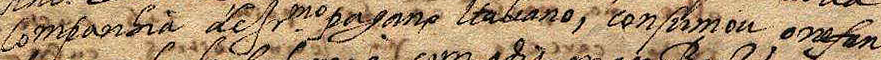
Companhia de Jr.mo pagano Italiano, consumou o nefan
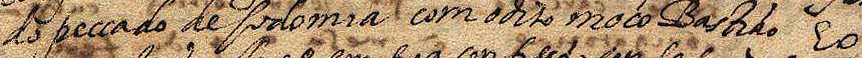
do peccado de sodomia com o dito moco Bastião E o
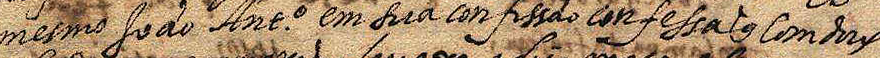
mesmo João Ant.o em sua confissão confessa q̄ com dous
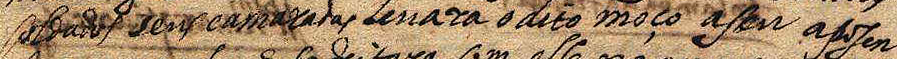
soldados seus camaradas leuara o dito moço a seu aposen
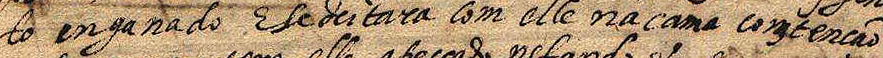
to enganado E se deitara com elle na cama com tençaõ
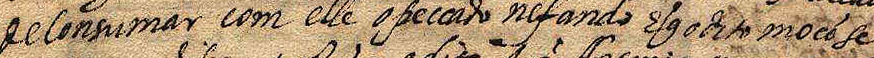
de consumar com elle o peccado nefando E q̄ o dito moco se
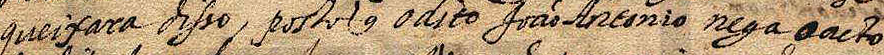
queixara disso, posto q̄ o dito Joaõ Antonio nega o acto
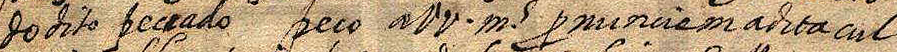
do dito peccado peço a VV. ms ꝓnunciem a dita cul
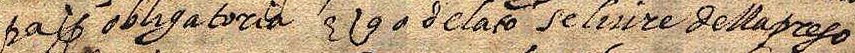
pa p̄ obligatoria E q̄ o delato se liure della preso
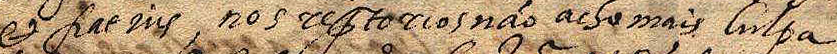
et fiat ius, nos rep̄torios não acho mais Culpa
